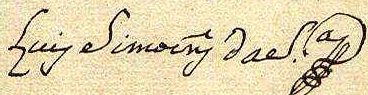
Luis Simoen̄s da S.a
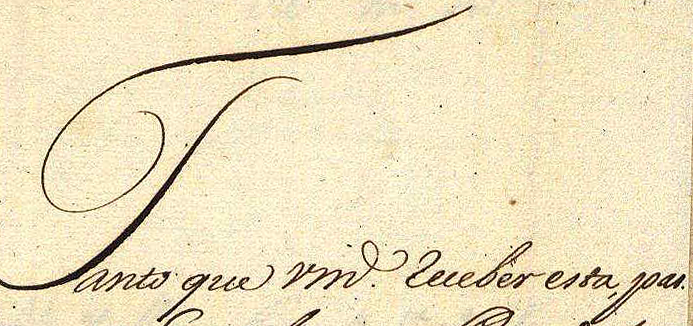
Tanto que v m.e Receber esta, pas.
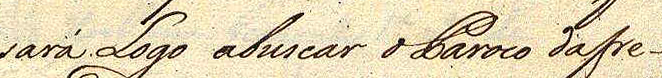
sará Logo a buscar o Paroco da fre
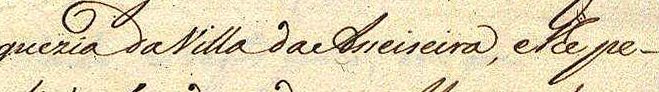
guezia da Villa da Asseiseira, e lhe pe
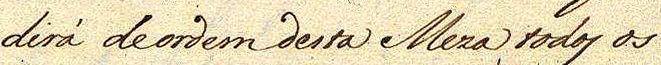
dirá de ordem desta Meza todos os
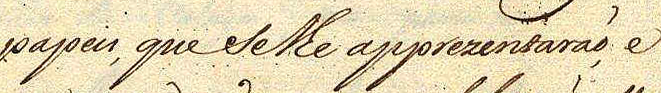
papeis, que se lhe apprezentaraõ, e
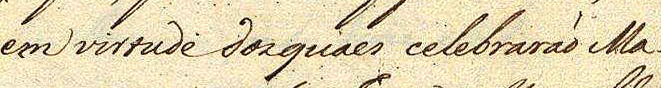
em virtude dos quaes celebraraõ Ma
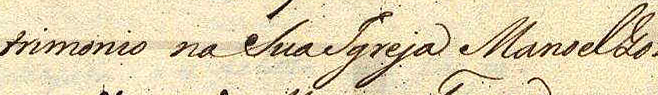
trimonio na Sua Igreja Manoel Go
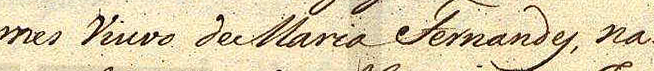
mes Viuvo de Maria Fernandes, na
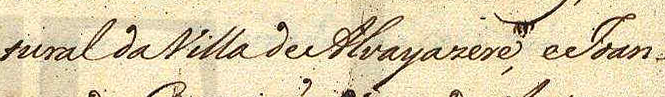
tural da Villa de Alvayazere, e Ioan
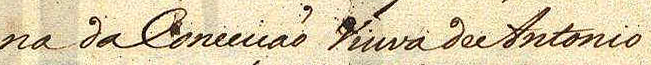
na da Conceiçaõ Viuva de Antonio
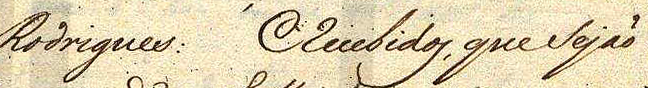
Rodrigues: E Recebidos, que sejaõ
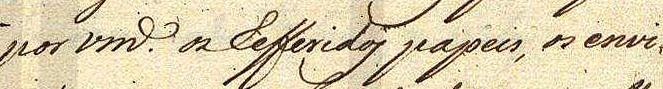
por vm.e os Refferidos papeis, os envi
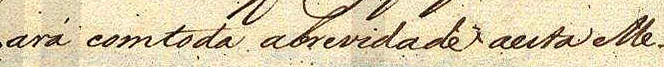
ará com toda a brevidade a esta Me
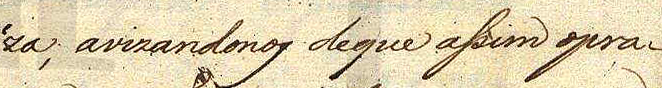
za, avizandonos de que assim o pra
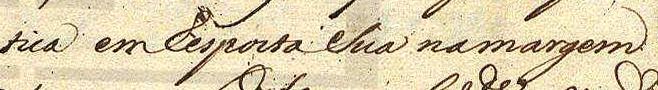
tica em Resposta Sua na margem
